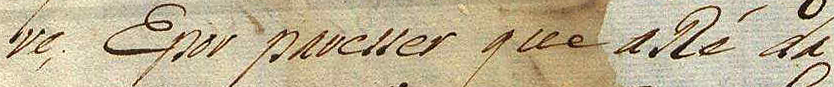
re, E por paresser que a Ré dá
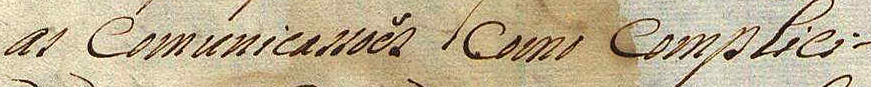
as comunicassoẽs como complici
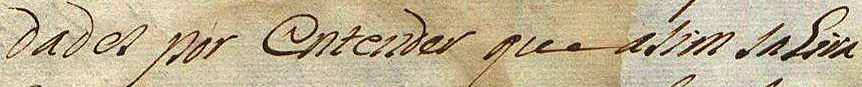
dades por entender que asim sahira
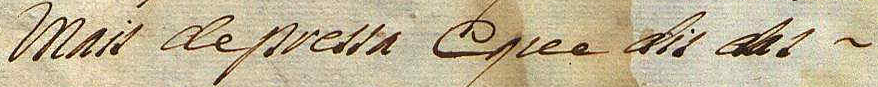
mais depressa e que dis das
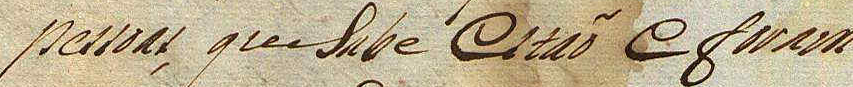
pessoas, que Sabe estaõ e foram
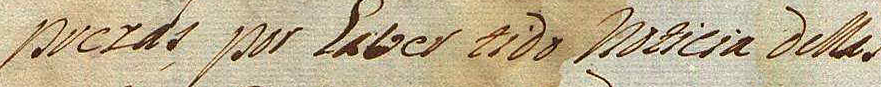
prezas, por haver tido noticia dellas
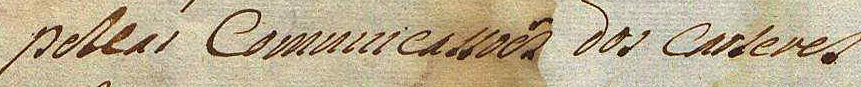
pellas comunicassoẽs dos carseres
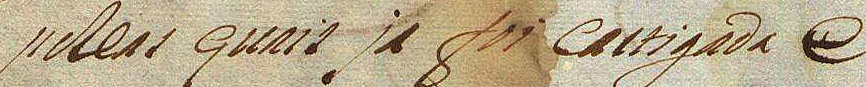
pellas quais ja foi castigada e
